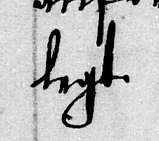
legt:
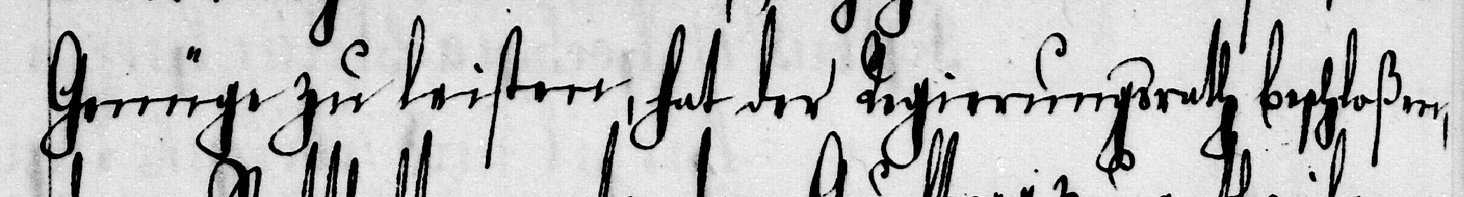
Genüge zu leisten, hat der Regierungsrath beschloße¬
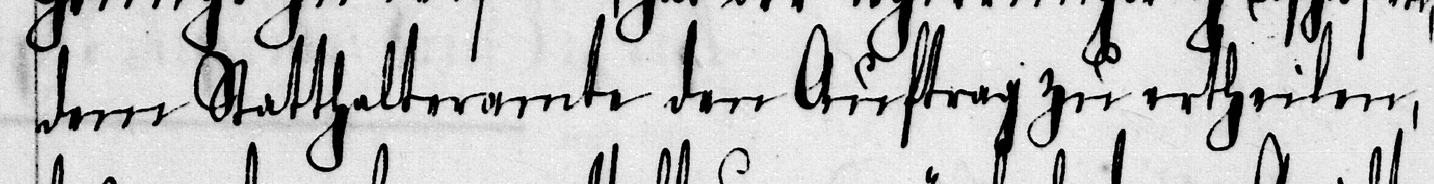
dem Statthalteramte den Auftrag zu ertheilen,
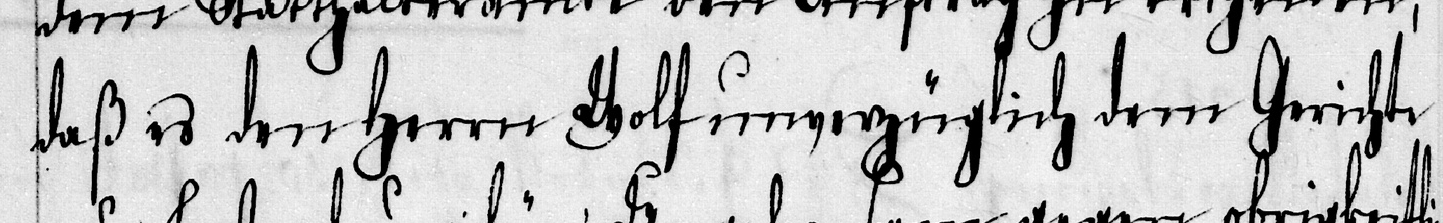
daß es den Herrn Wolf unverzüglich dem Gerichte
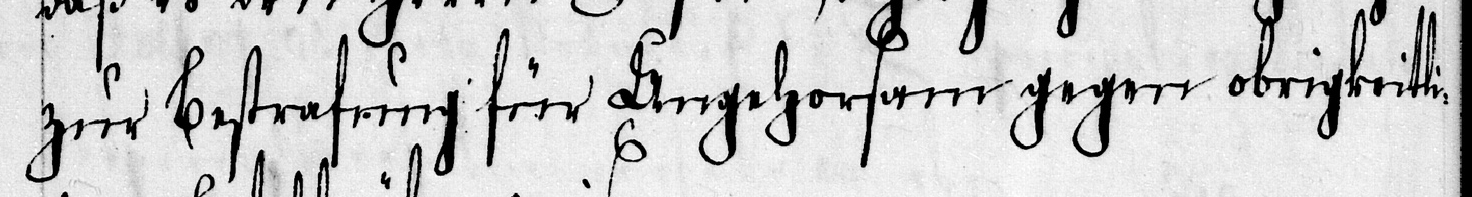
zur Bestrafung für Ungehorsam gegen obrigkeitli¬
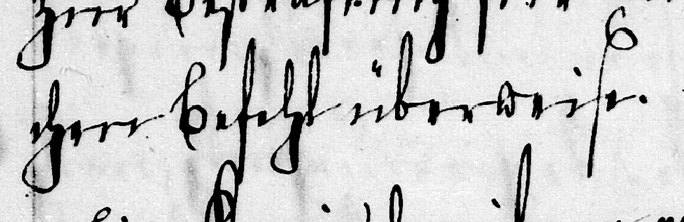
chen Befehl überweise.
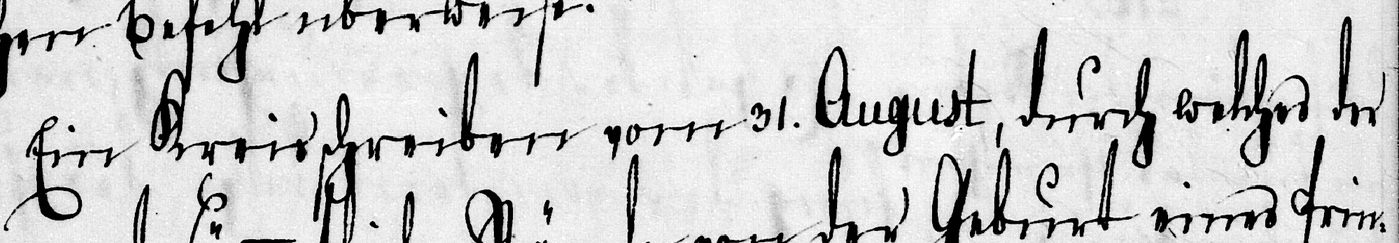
Ein Kreisschreiben vom 31. August, durch welches der
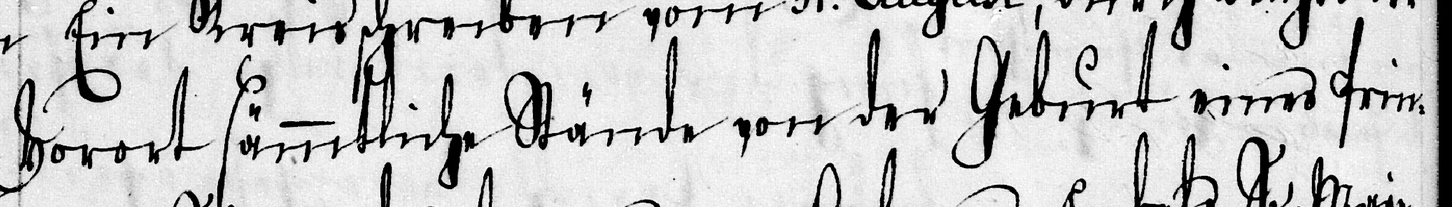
Vorort sämmtliche Stände von der Geburt eines Prin¬
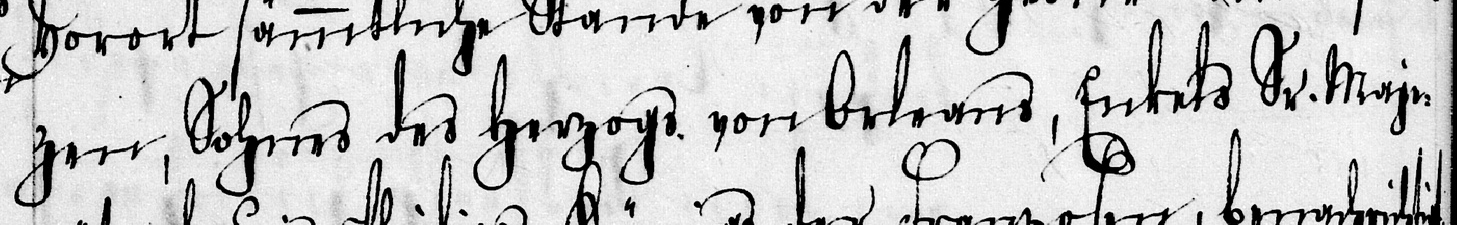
zen, Sohnes des Herzogs von Orleans, Enkels Sr. Maje¬
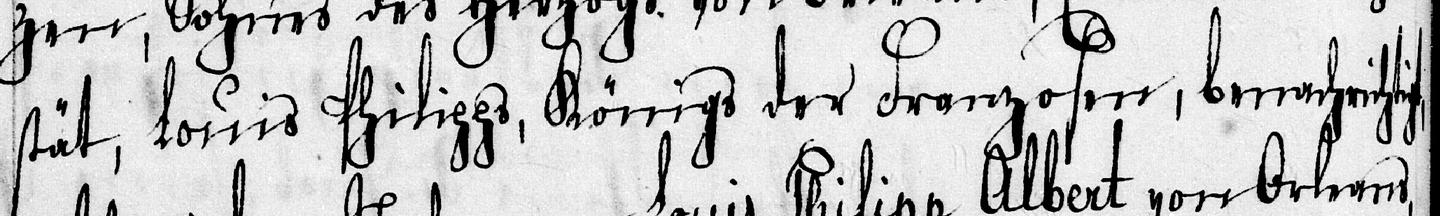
stät, Louis Philipps, Königs der Franzosen, benachrich¬
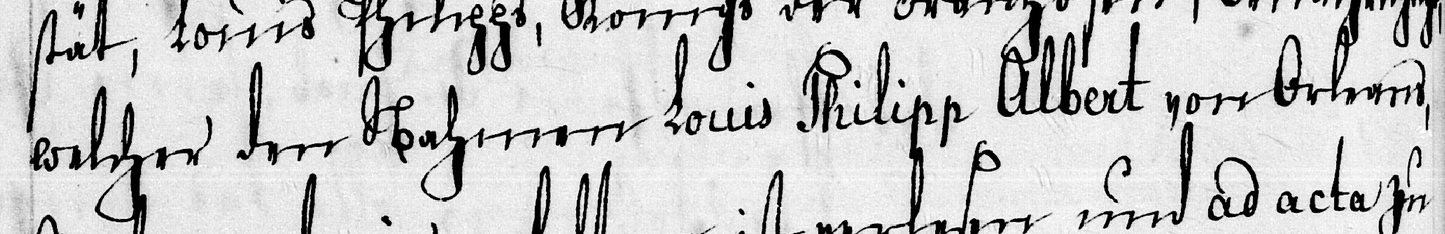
welcher den Nahmen Louis Philipp Albert von Orleans,
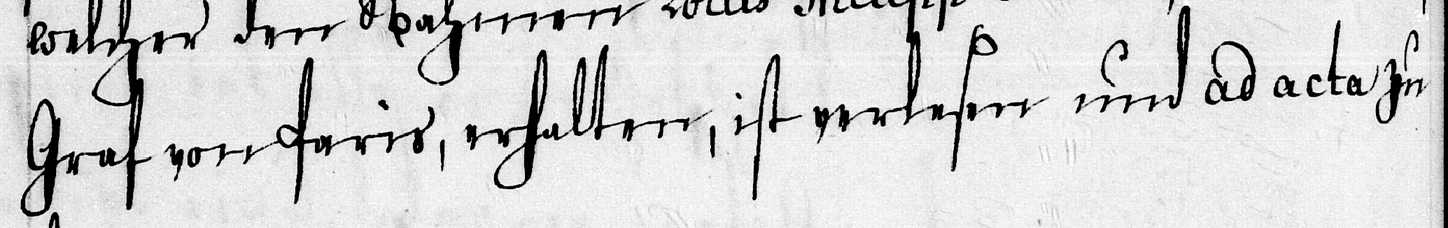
Graf von Paris, erhalten, ist verlesen und ad acta zu
